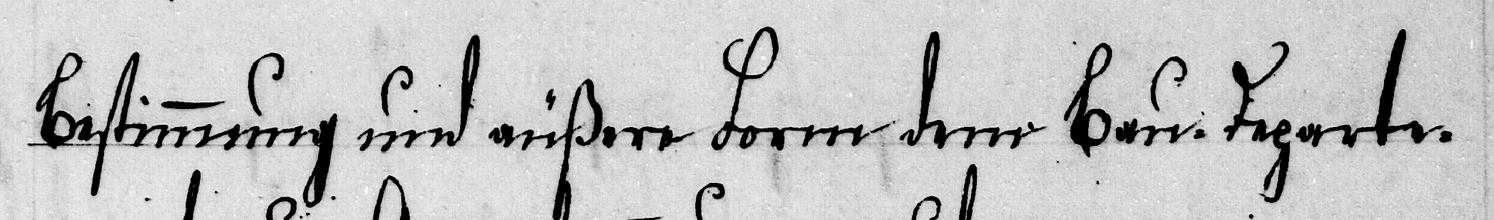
Bestimmung und äußere Form dem Bau-Departe¬
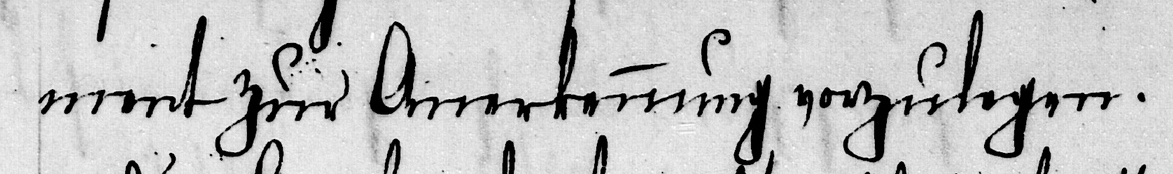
ment zur Anerkennung vorzulegen.
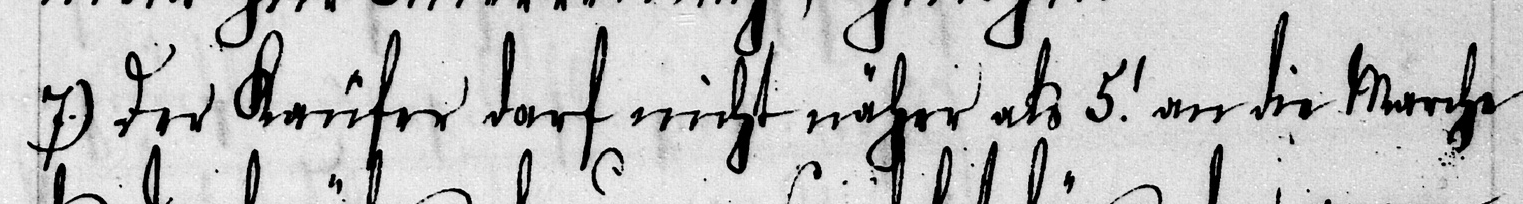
7.) Der Käufer darf nicht näher als 5’. an die Marche
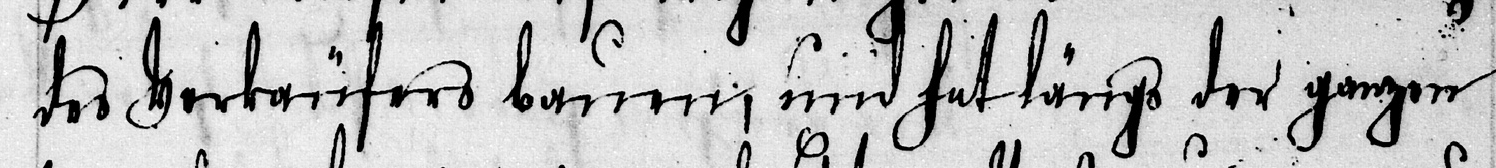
des Verkäufers bauen, und hat längs der ganzen
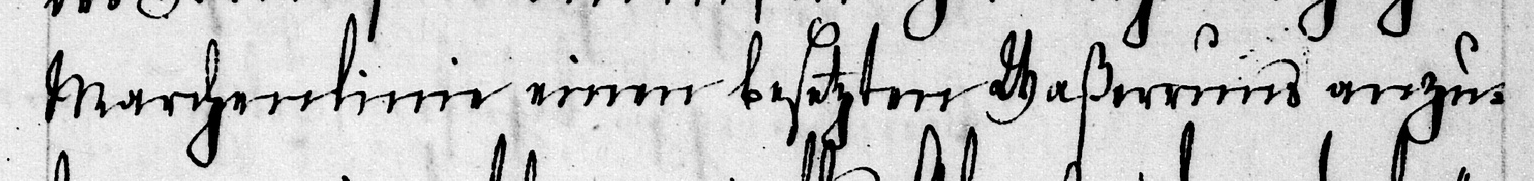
Marchenlinie einen besetzten Waßerruns anzu¬
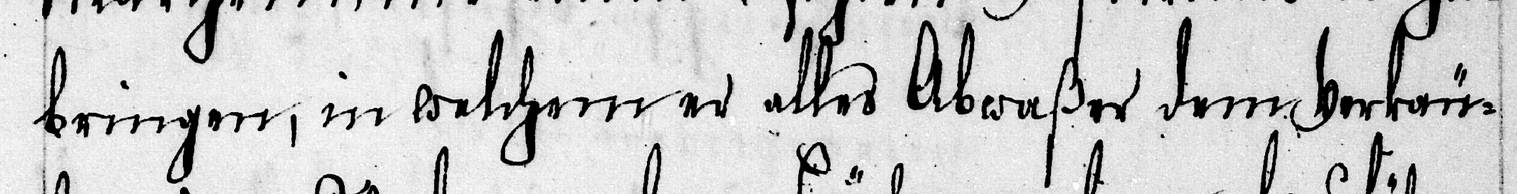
bringen, in welchem er alles Abwaßer dem Verkäu¬
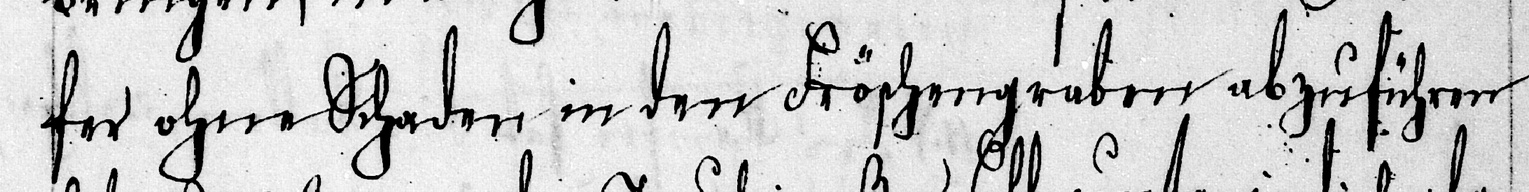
fer ohne Schaden in den Fröschengraben abzuführen
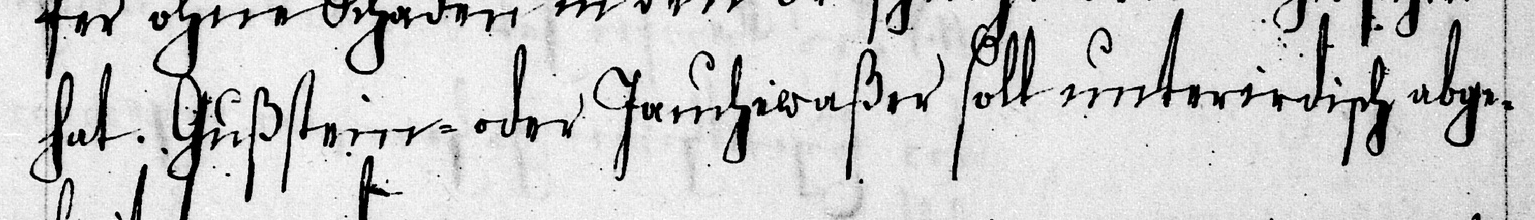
hat. Gußstein- oder Jauchewaßer soll unterirdisch abge¬
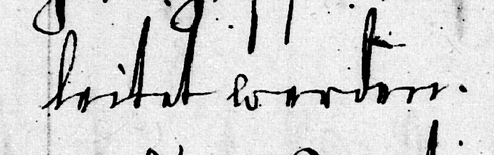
leitet werden.
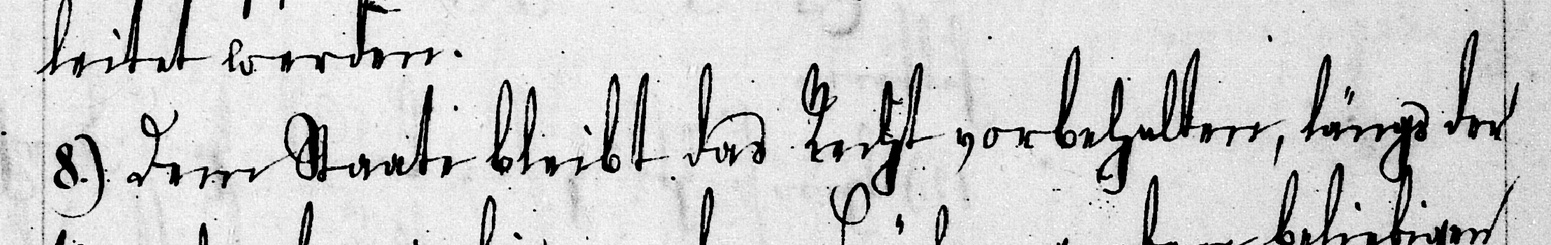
8.) Dem Staate bleibt das Recht vorbehalten, längs der
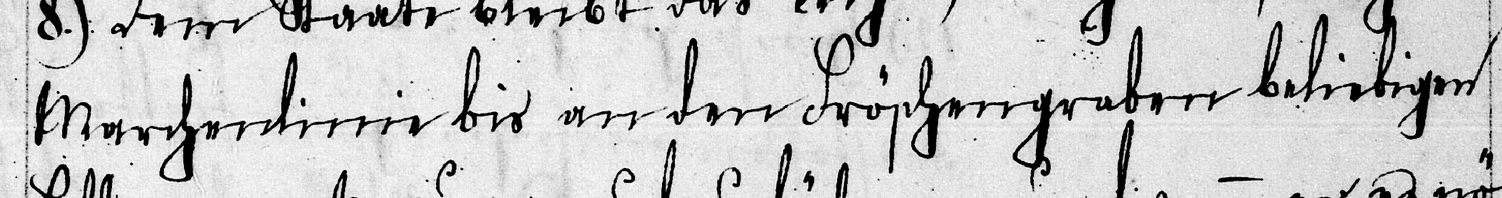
Marchenlinie bis an den Fröschengraben beliebigen
